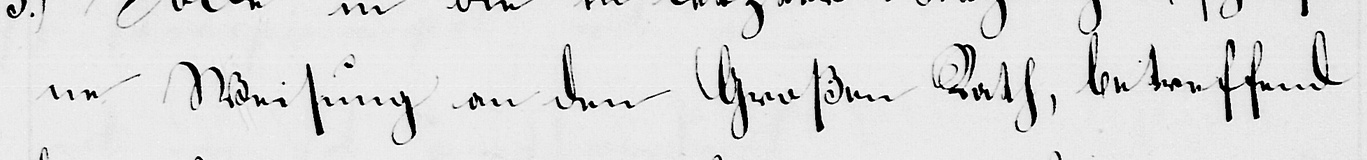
ne Weisung an den Großen Rath, betreffend
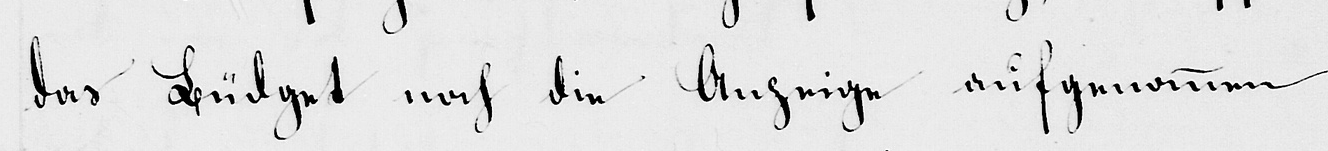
das Büdget noch die Anzeige aufgenommen
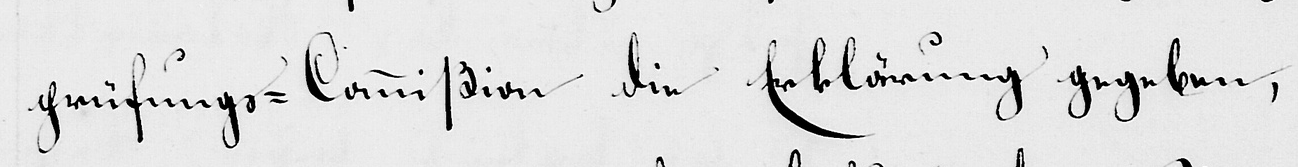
rüfungs-Commißion die Erklärung gegeben,
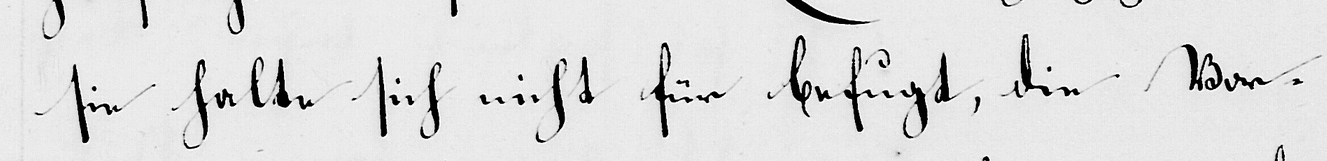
sie halte sich nicht für befugt, die Vor¬
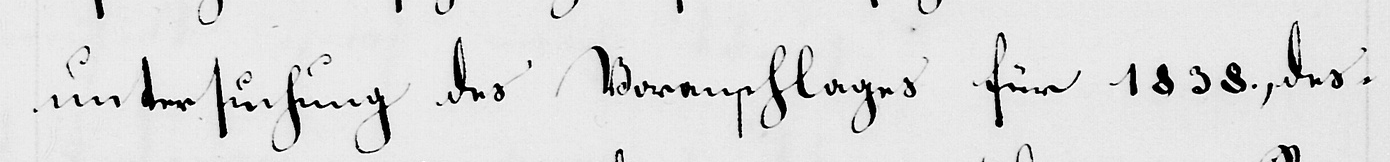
untersuchung des Voranschlages für 1838., des¬
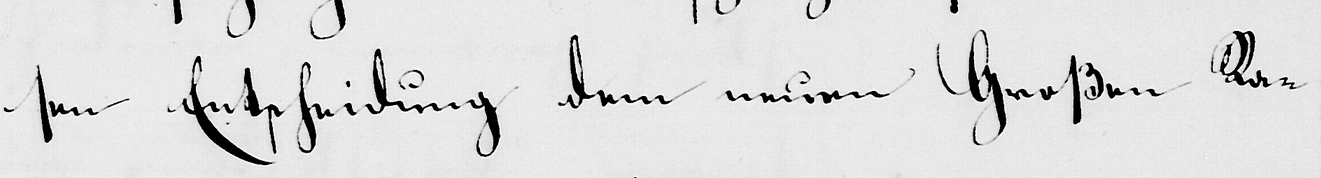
sen Entscheidung dem neuen Großen Ra¬
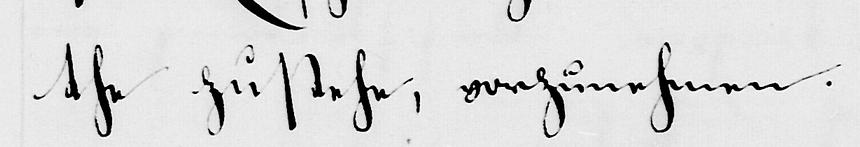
the zustehe, vorzunehmen.
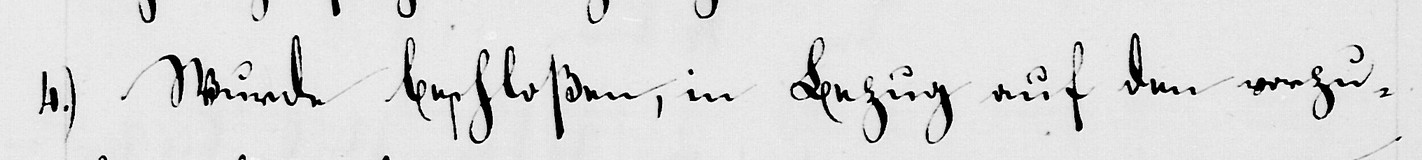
4.) Wurde beschloßen, in Bezug auf den vorzu¬
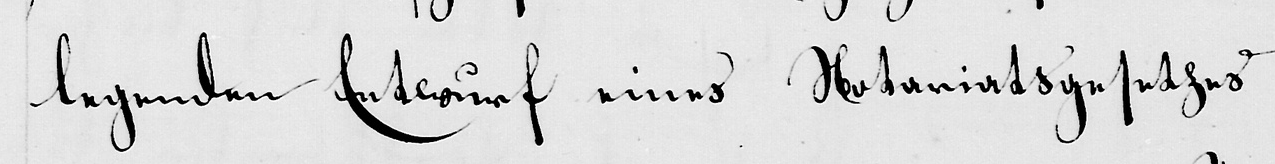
legenden Entwurf eines Notariatsgesetzes
